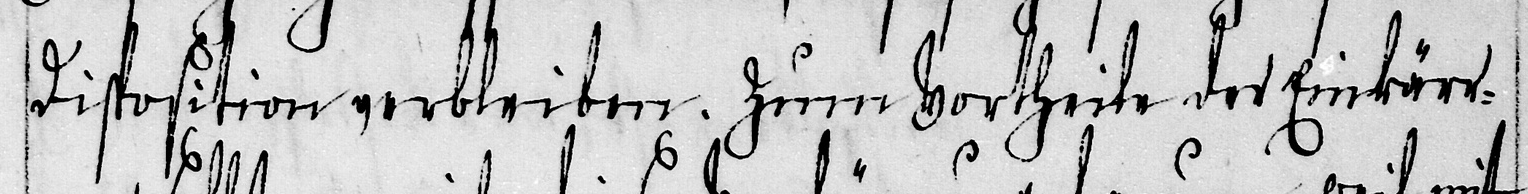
Disposition verbleiben. Zum Vortheile der Einkärr¬
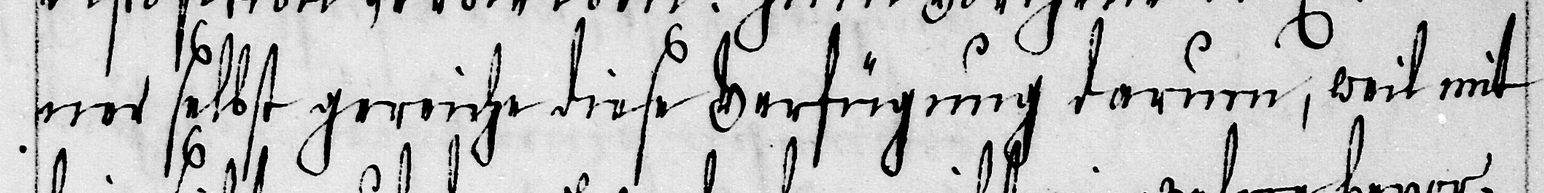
ner selbst gereiche diese Verfügung darum, weil mit
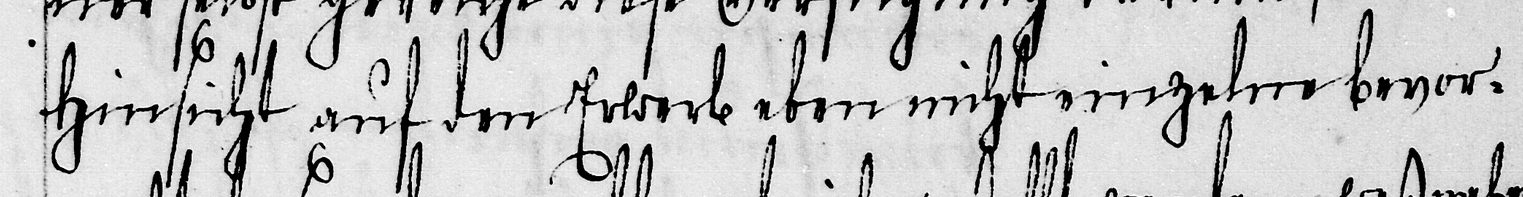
Hinsicht auf den Erwerb eben nicht einzelne bevor¬
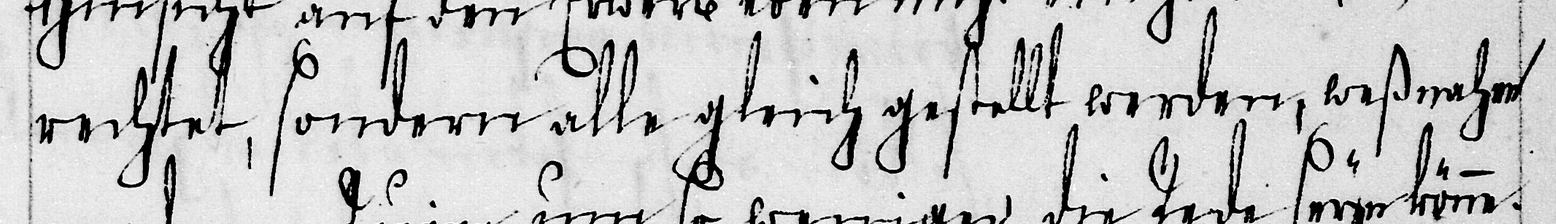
rechtet, sondern alle gleich gestellt werden, weßnahen
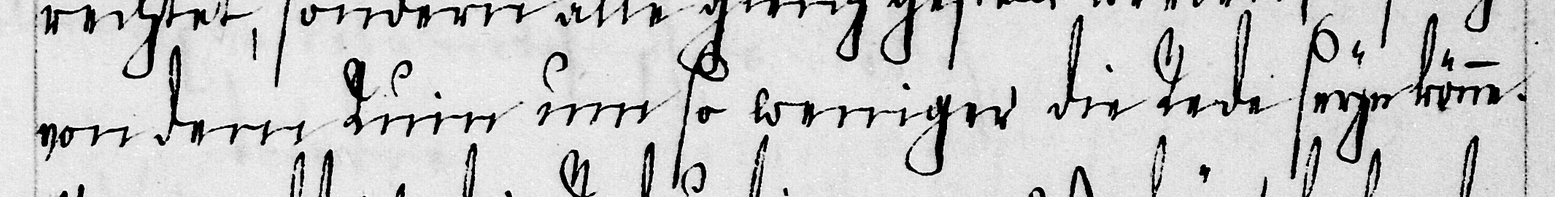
von dem Ruin um so weniger die Rede seyn könne.
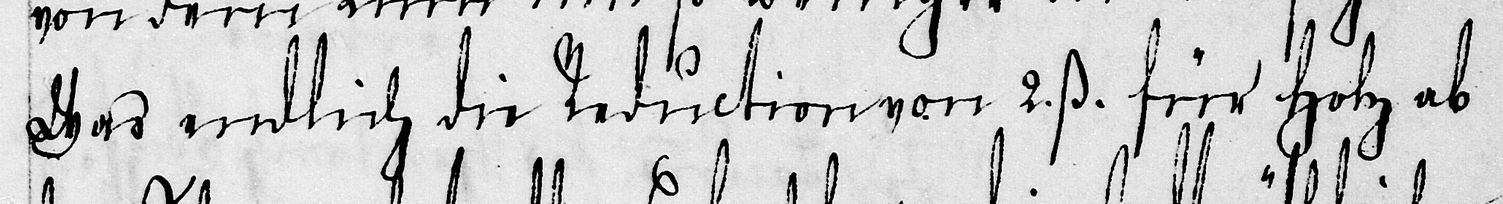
Was endlich die Reduction von 2. ß. für Holz ab
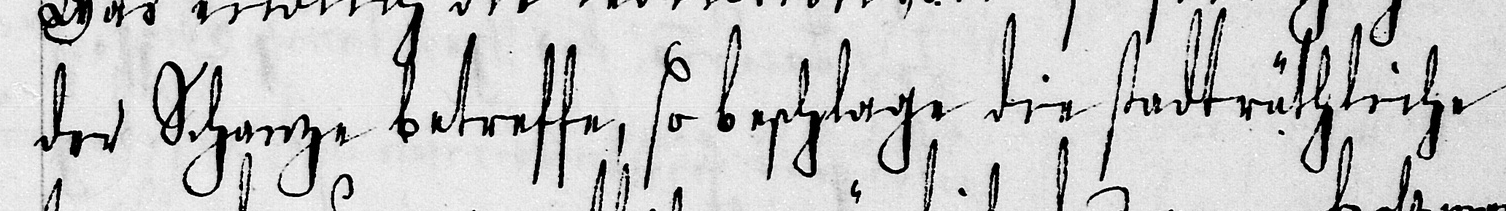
der Schanze betreffe, so beschlage die stadträthliche
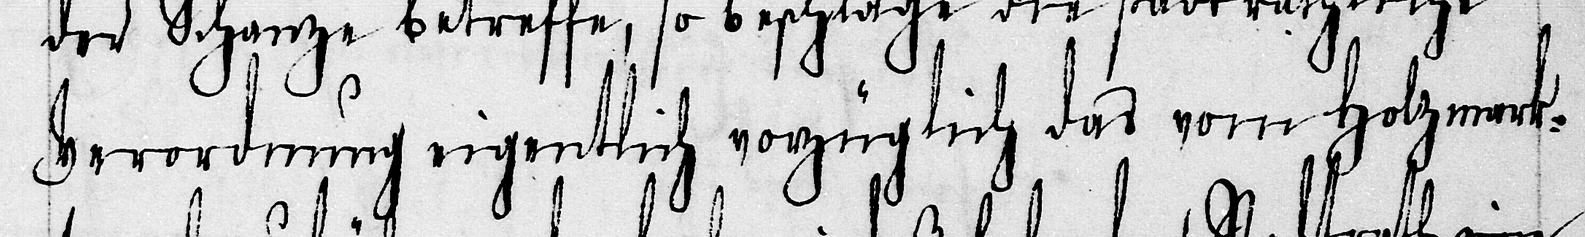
Verordnung eigentlich vorzüglich das vom Holzmark¬
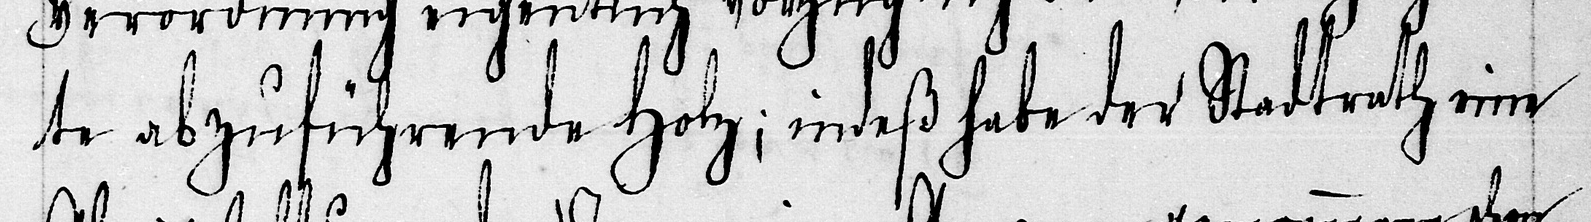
te abzuführende Holz; indeß habe der Stadtrath eine
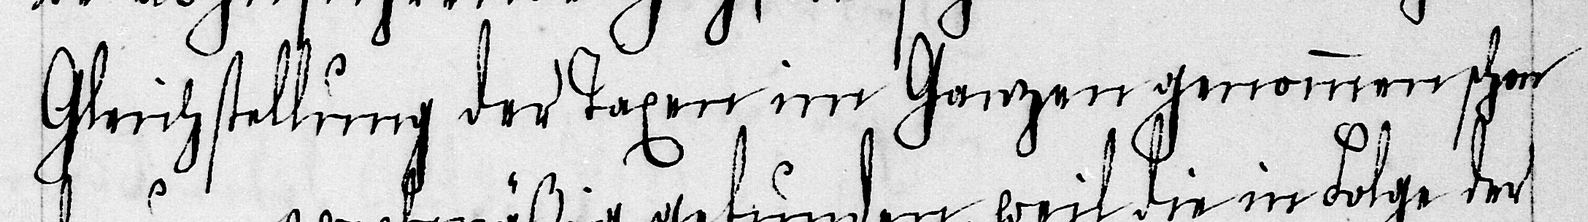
Gleichstellung der Taxen im Ganzen genommen schon
